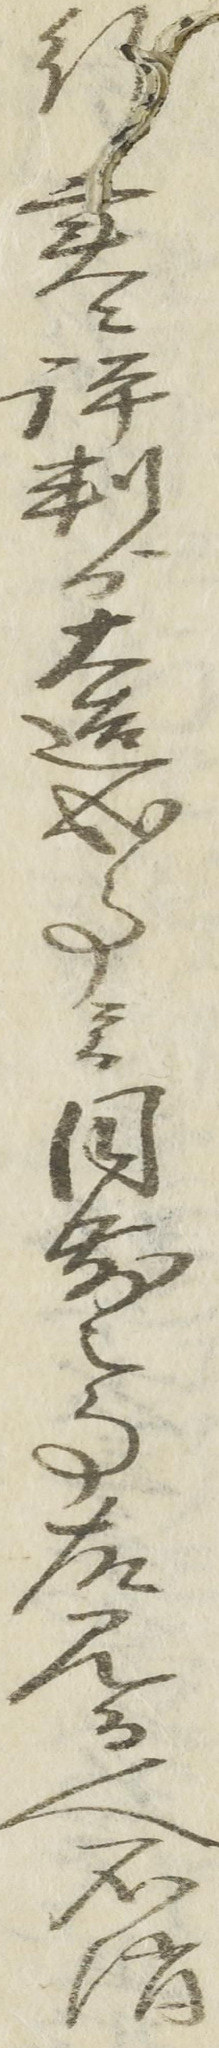行候実ニ評判ゟ大造成事ニ而目前之事故見る人不消
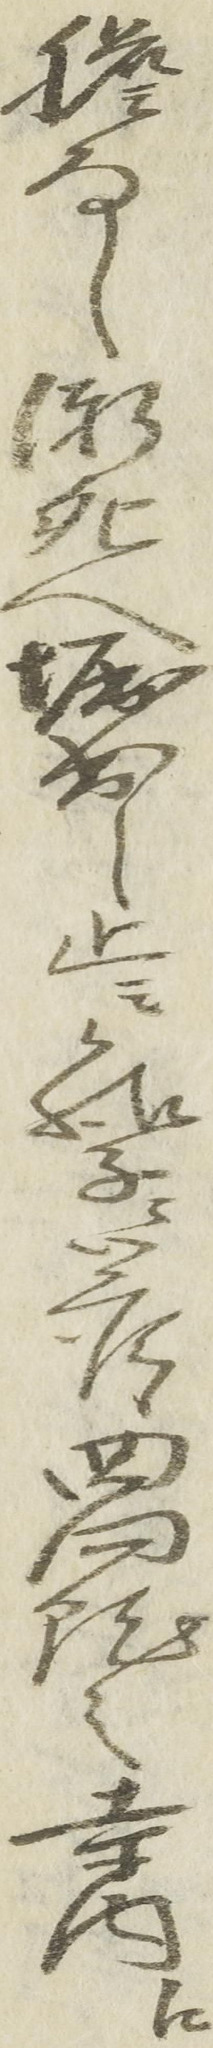膽なし漸死人掘出し止ミ候様子ニ御座候回向院之寺内江
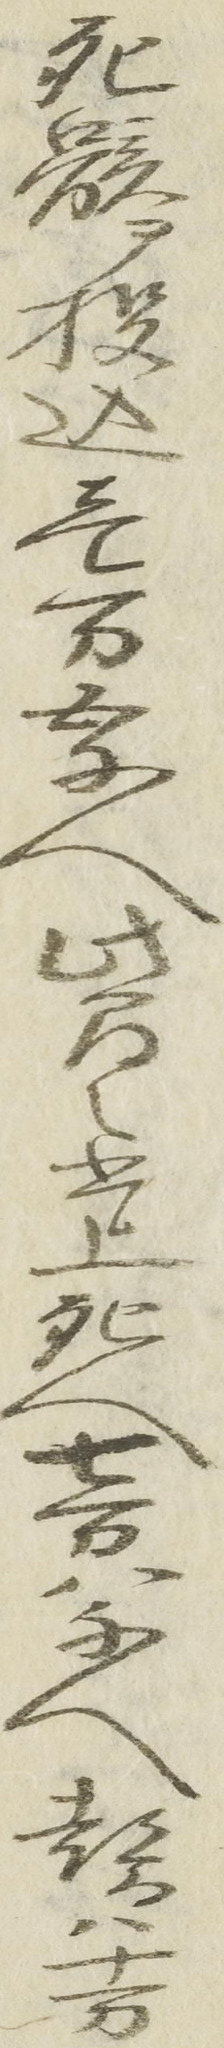死骸ヲ投込壱万五千人此間之書上死人七万八千人都而ハ十万
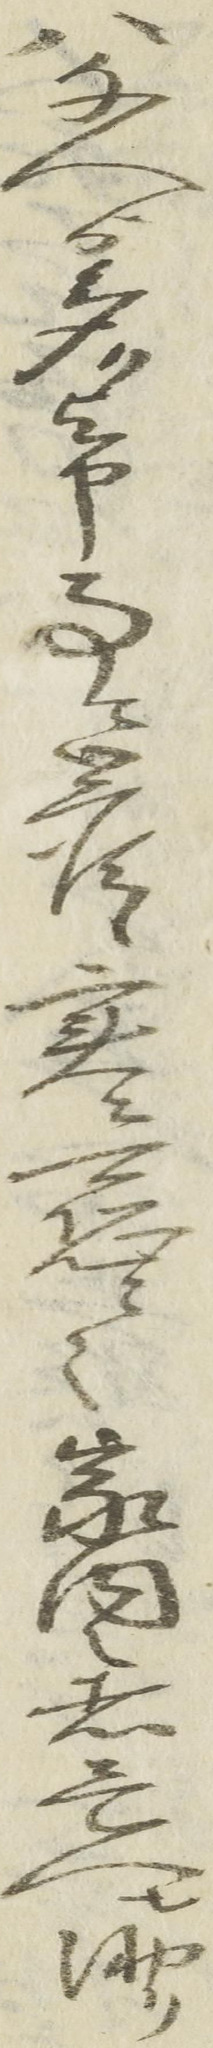八千人ゟ多くと申事ニ御座候実ニ可恐〻也家内之者壱人も助り
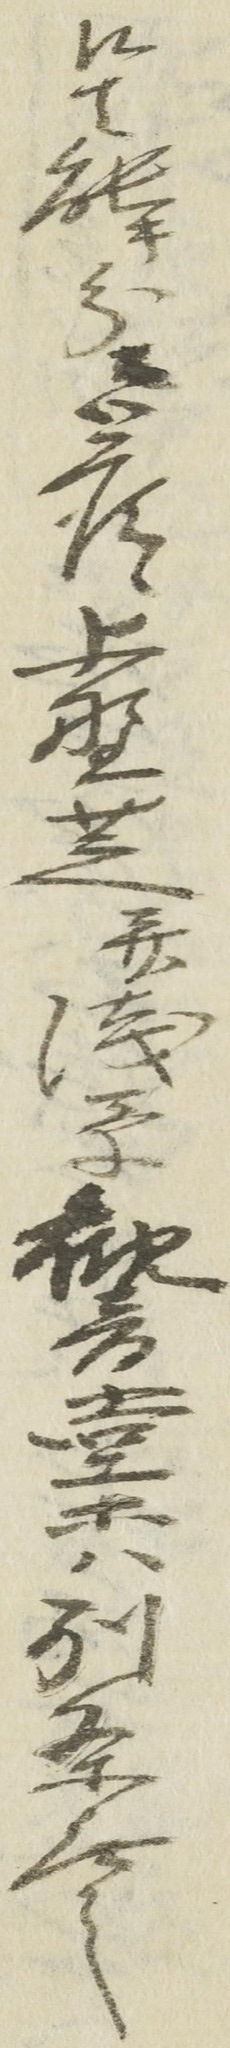候は能キ分ニ御座候上野芝幷浅草観音堂等ハ別条無之
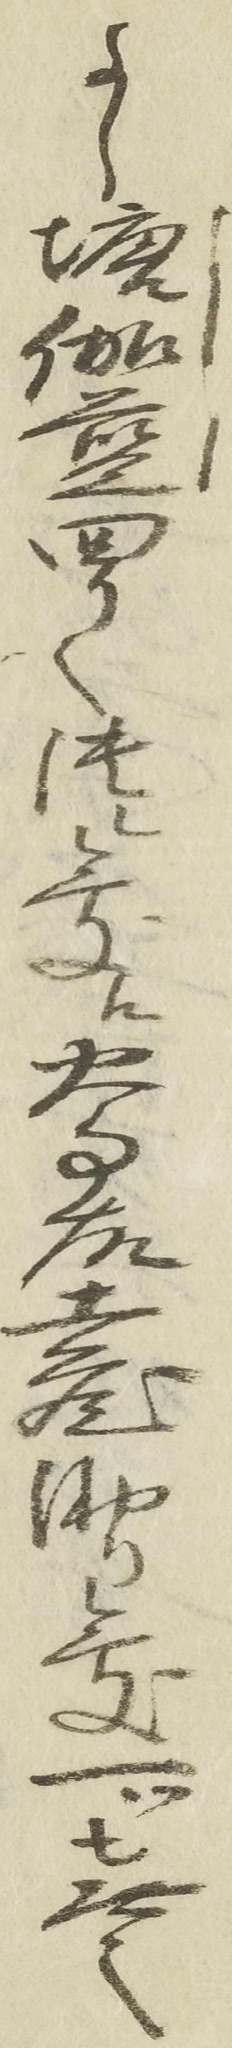よし塘伽藍回り之潰レ候処江火事故土蔵助り候処一ツも無之
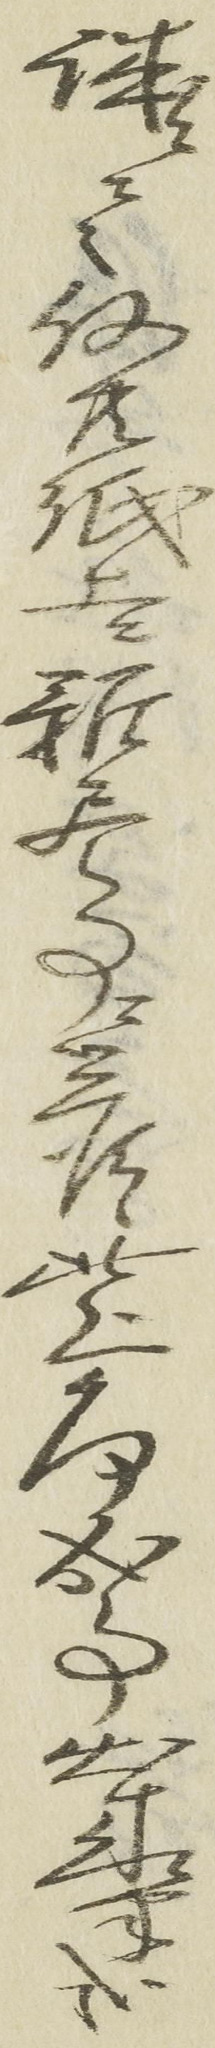誠ニて何共紙上ニ難尽事ニ御座候此上如何成事出来申候哉
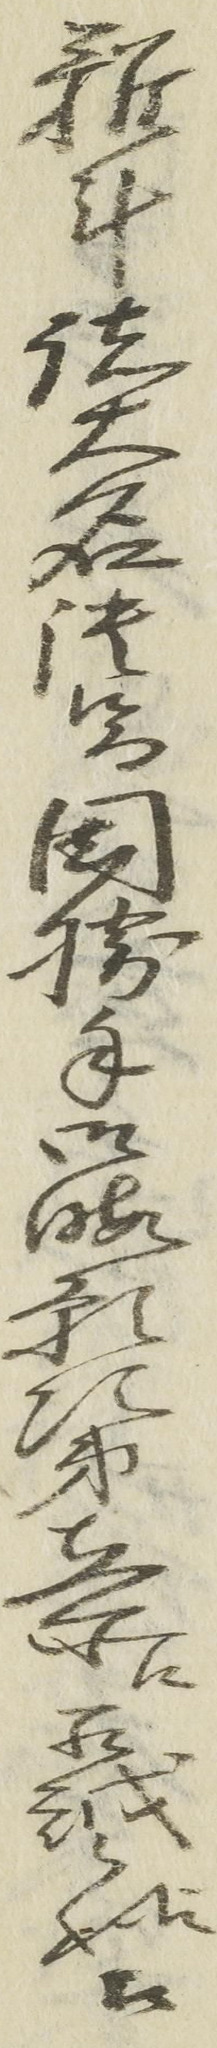難計諸大名潰ニ而国勝手御暇願次第在所江罷越候様被
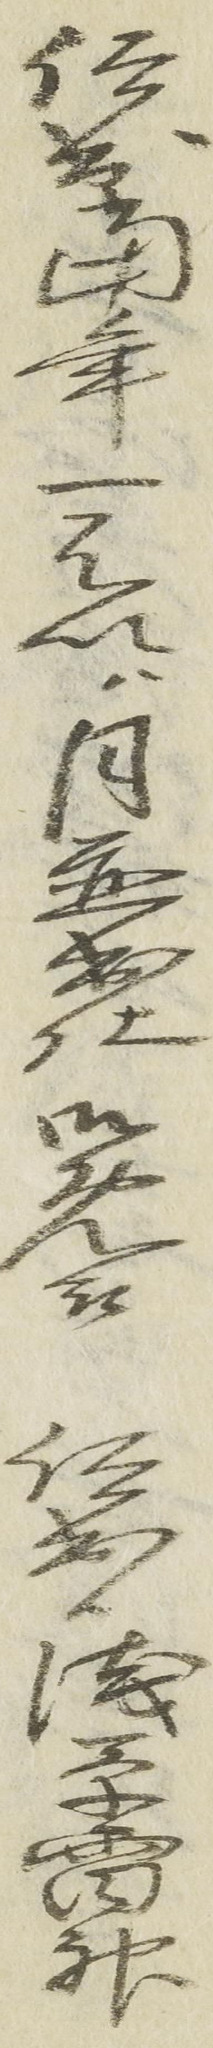仰出当年一先以ハ月並出仕御免被仰出候浅草雷神
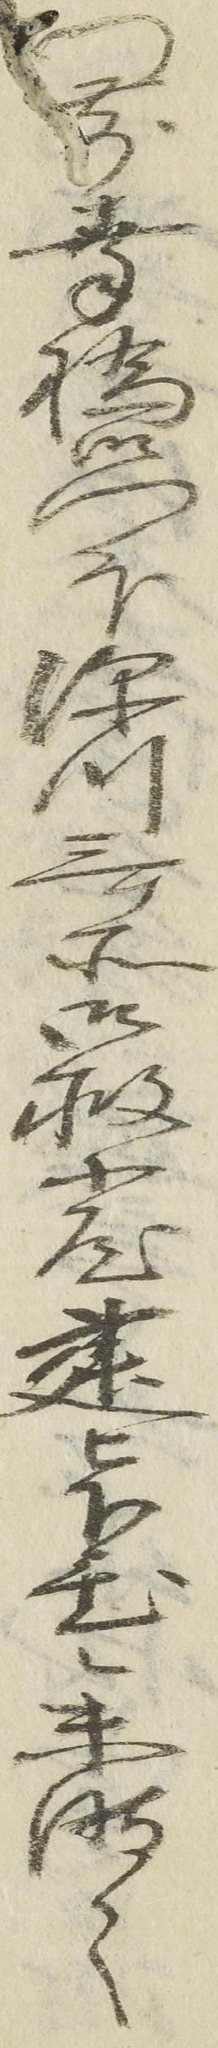門前幸橋御門下深川三ケ所御救小屋建被下置候未時〻
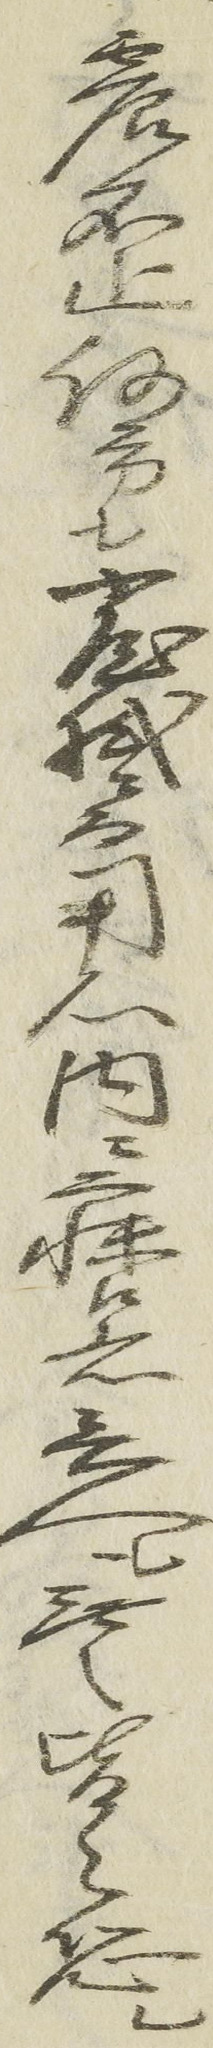震不止何方も小屋掛ニ而用心内二寝候者壱人も無之皆〻恐レ
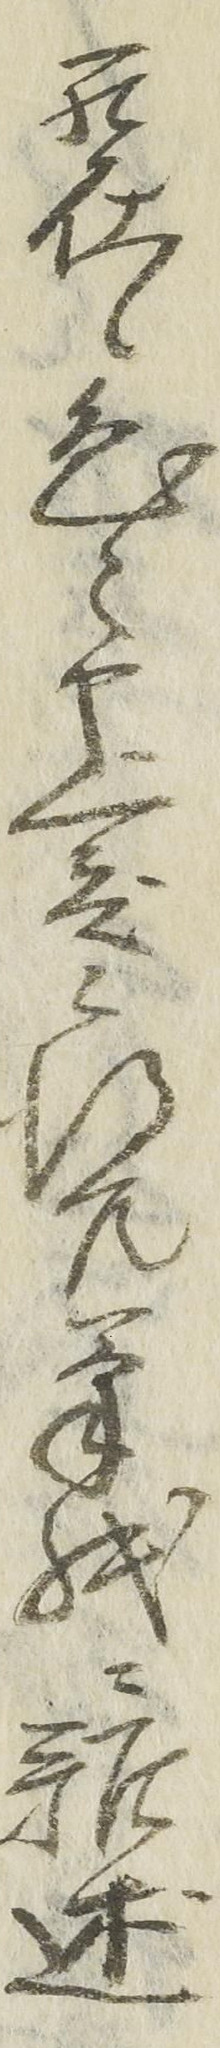罷仕候色〻申上度候得共筆紙ニ難述
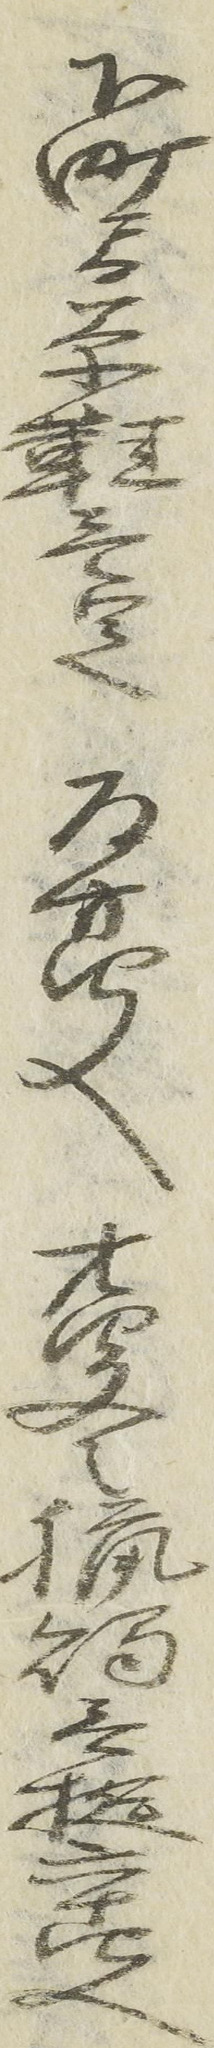一下町ニ而草鞋壱足百廿四文廿四文之蝋燭壱挺六十四文
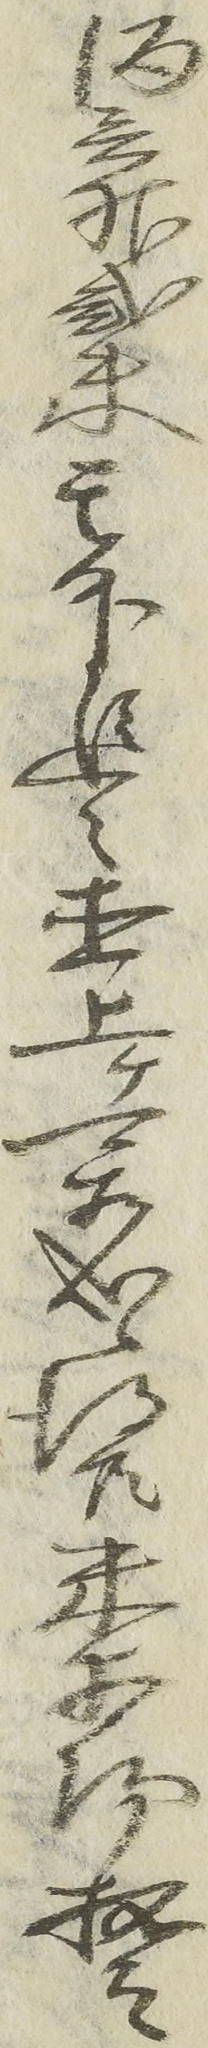酒壱升弐朱其外追〻直上ケ可相成候得共米相場抔は
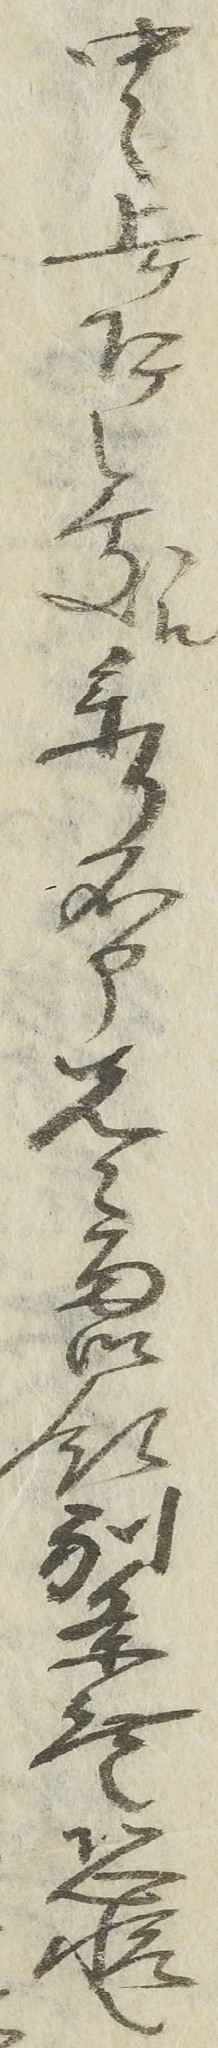中々上ケ下ケ候処江参り不申先〻多御領別条無之恐悦之事御座候

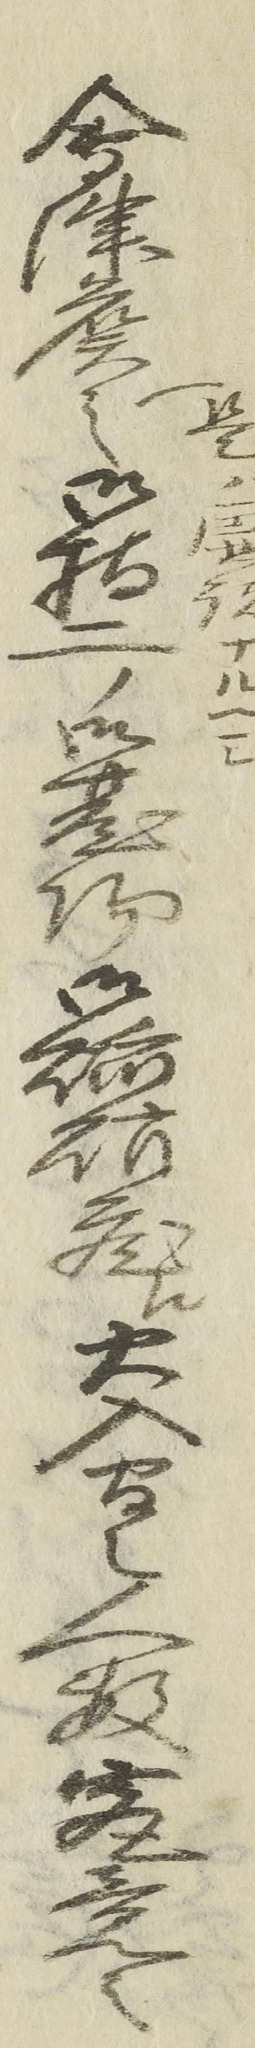一会津侯之御持二ノ御台場御焔硝蔵江火入間之人数究竟之
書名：安政乙卯江戸大地震筆記　安政丙辰八月大阪大雷雨之記追加　安政三辰年七月松前辺大地震并八月大風雨記録
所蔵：東京大学地震研究所図書室 Earthquake Research Institute Library, The University of Tokyo, JAPAN
